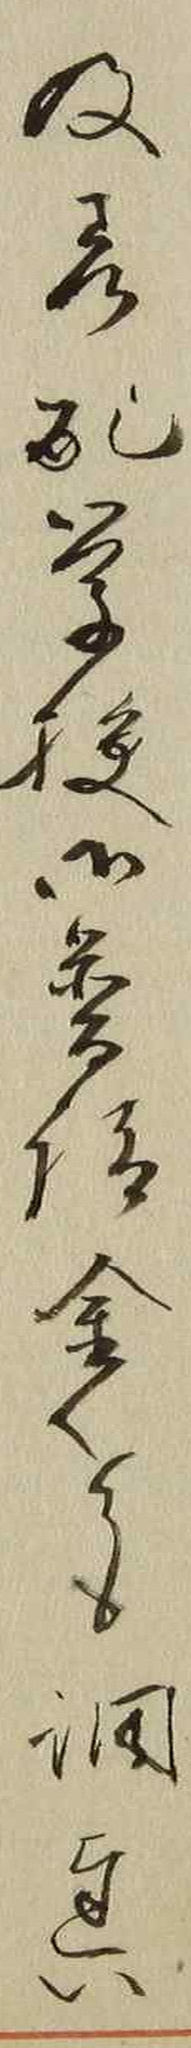及差配学校御普請金をも調達い
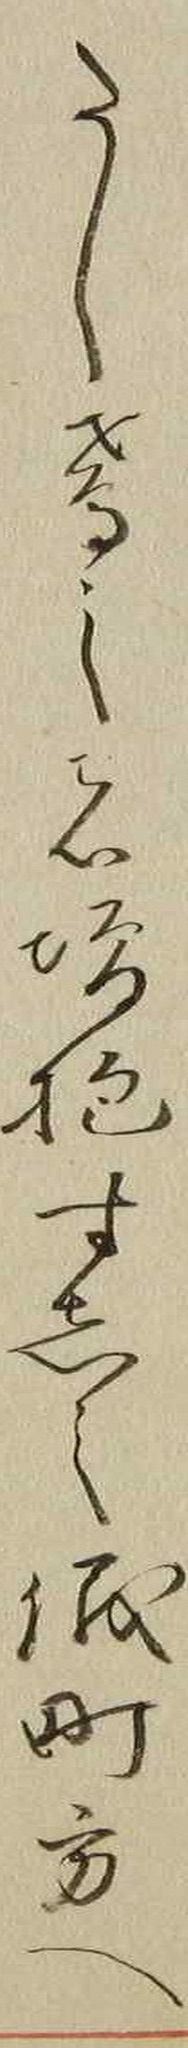たし鳶之者増抱寸志の儀町方へ
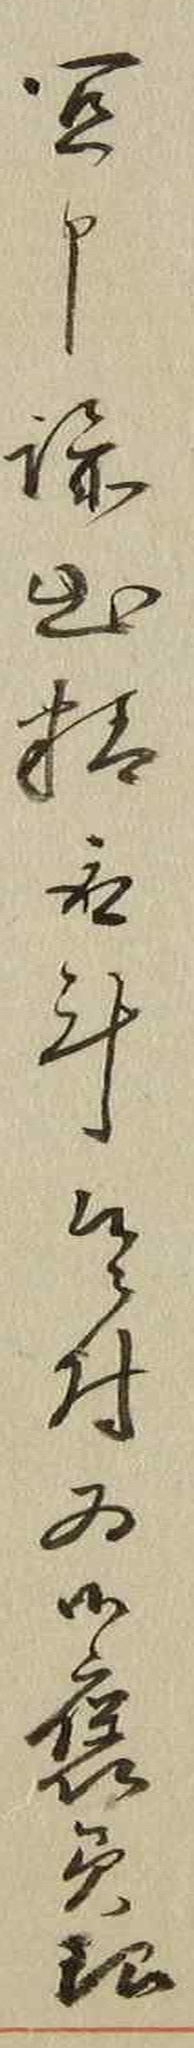宜申諭出精取計候に付為御褒美銀
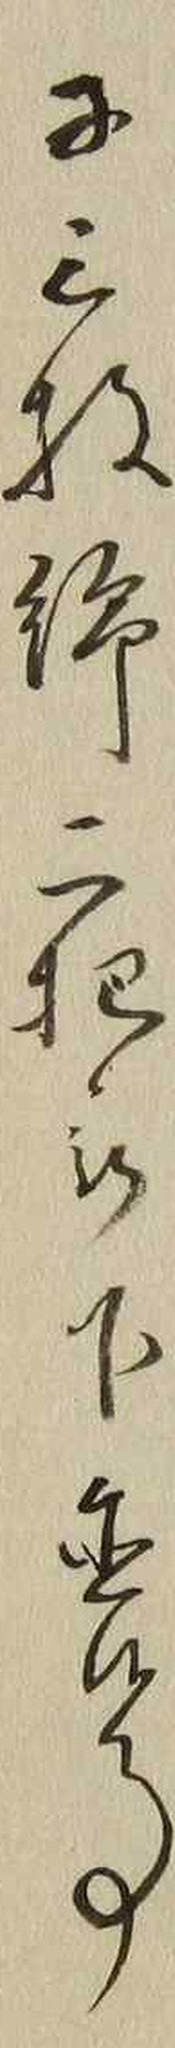子三枚綿二把被下置候事
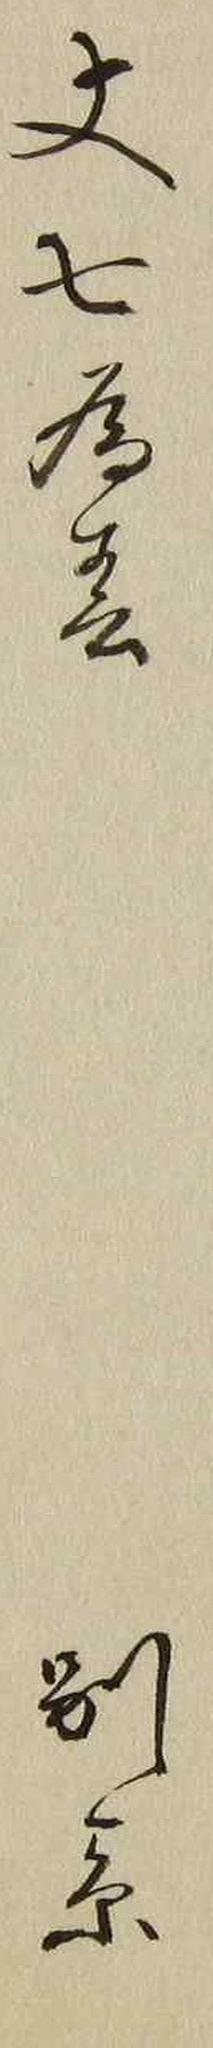丈七為春別系
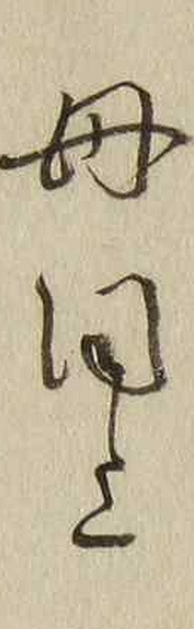母同上
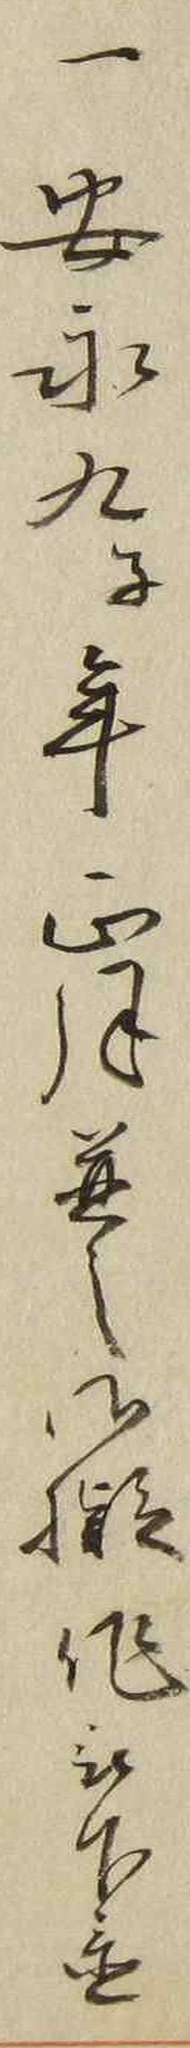一安永九子年正月並之御擬作被下置

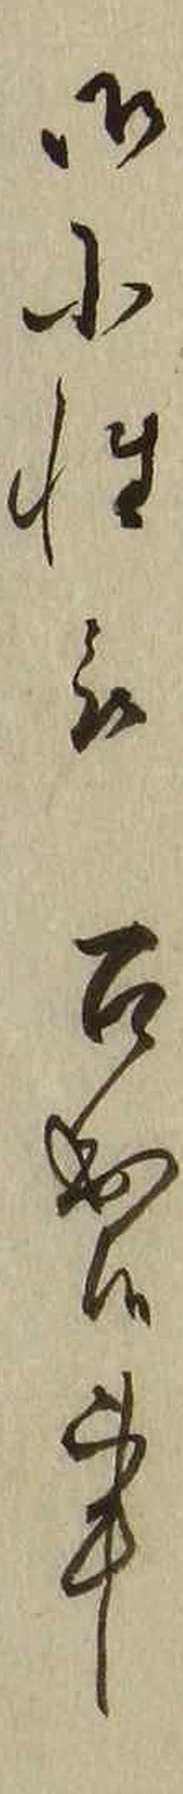御小性被召出候事
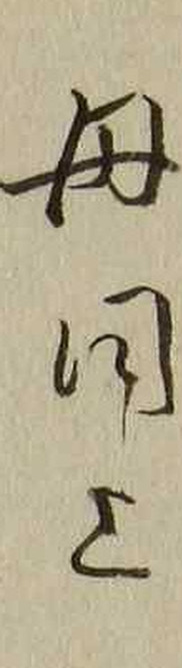母同上
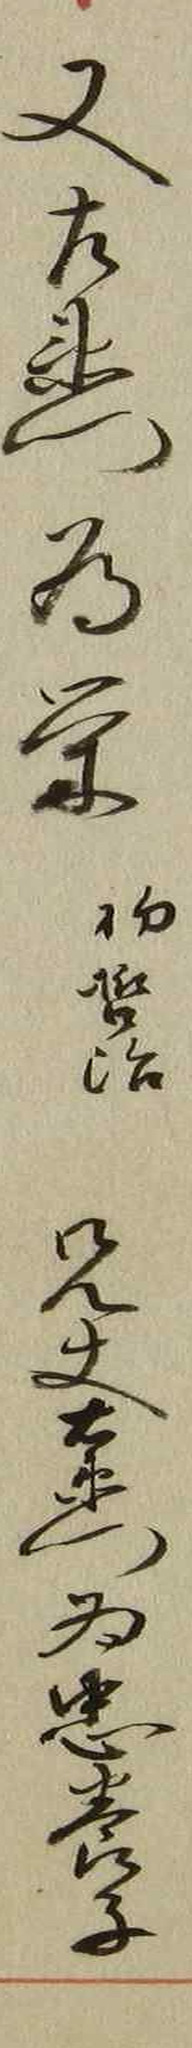又左衛門為栄初哲治兄丈右衛門為忠養子
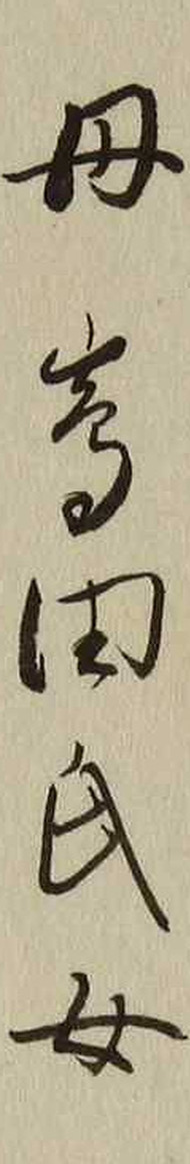母嶋田氏女
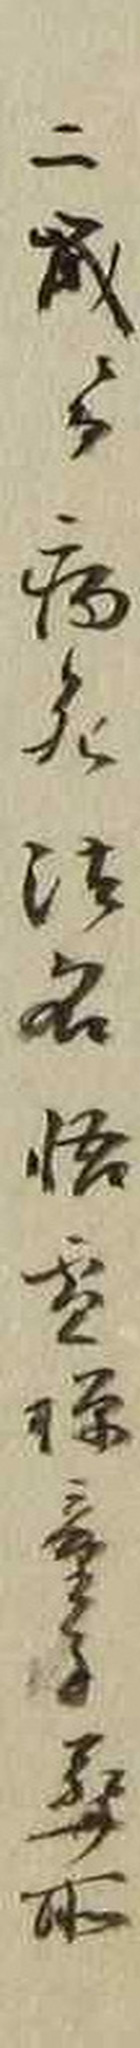二歳に而病死法名悟雪禅童子葬所
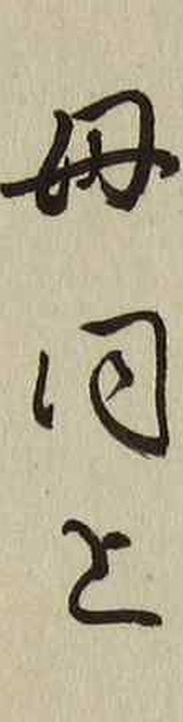母同上
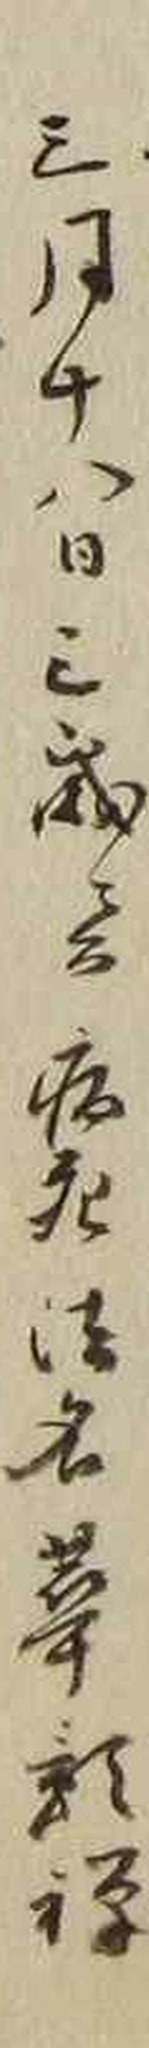三月十八日三歳に而病死法名葦親禅
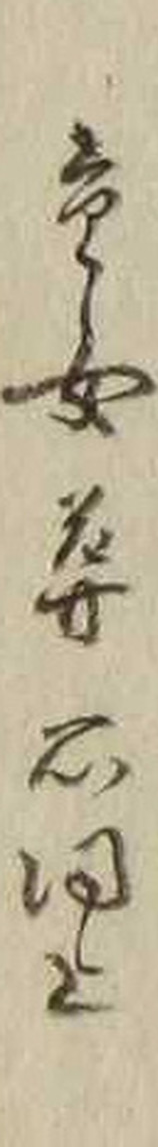童女葬所同上

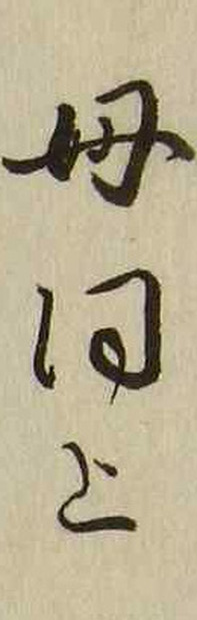母同上
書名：諸士系譜　巻之3　い之部3
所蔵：会津若松市立会津図書館
